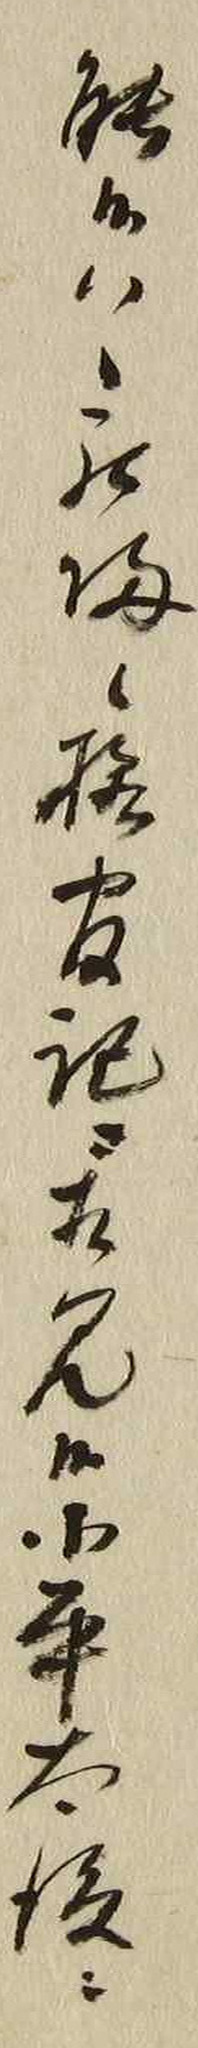能候はゝ罷帰候様官記に相見候小兵太後に
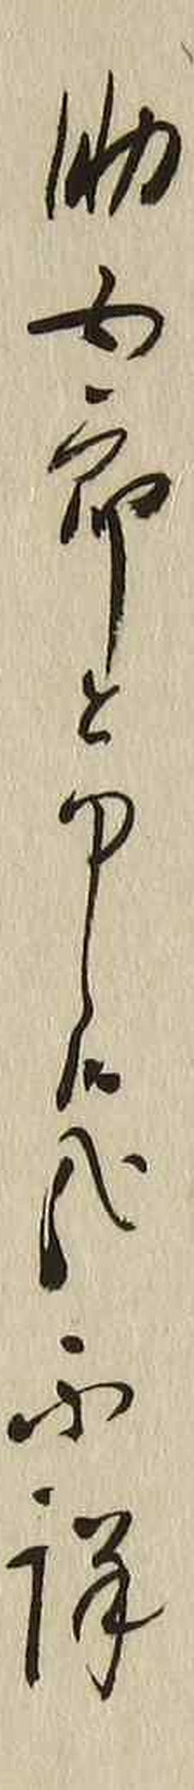助五郎と申候哉不詳
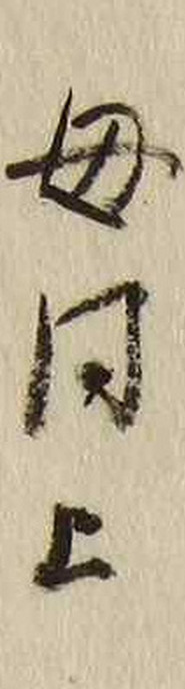母同上
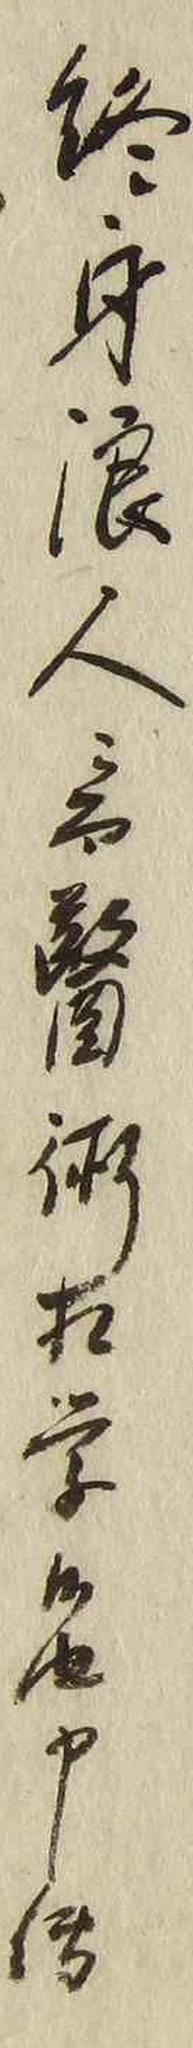終身浪人に而医術相学候由申伝
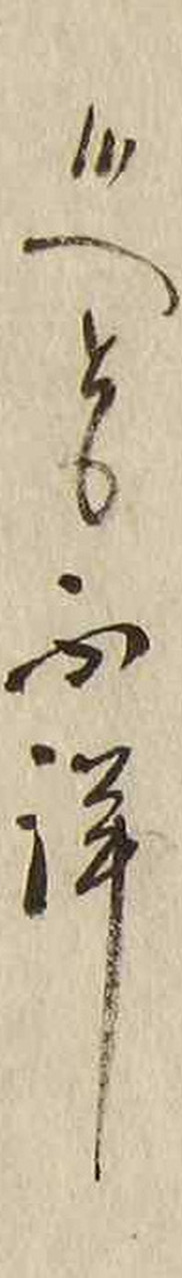候へとも不詳

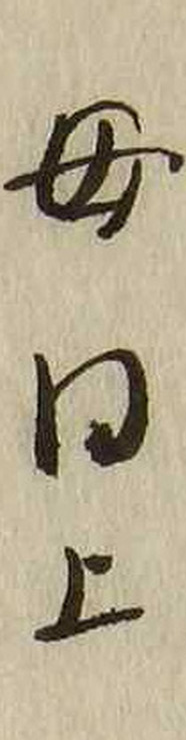母同上
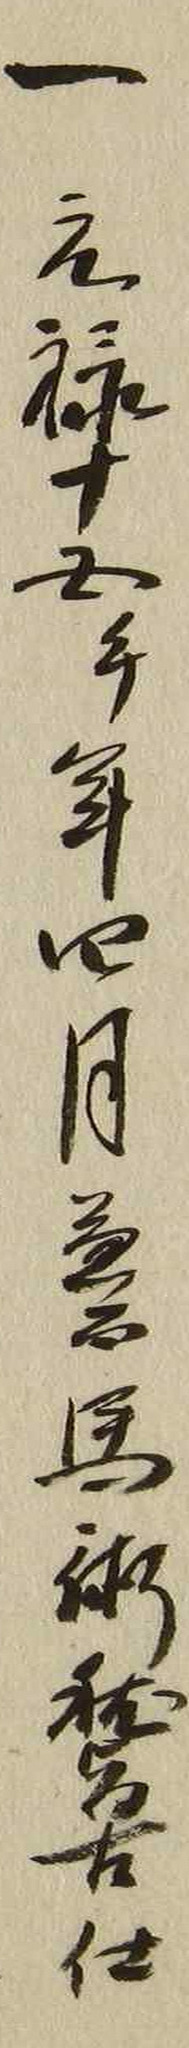一元禄十五午年四月兼而馬術稽古仕
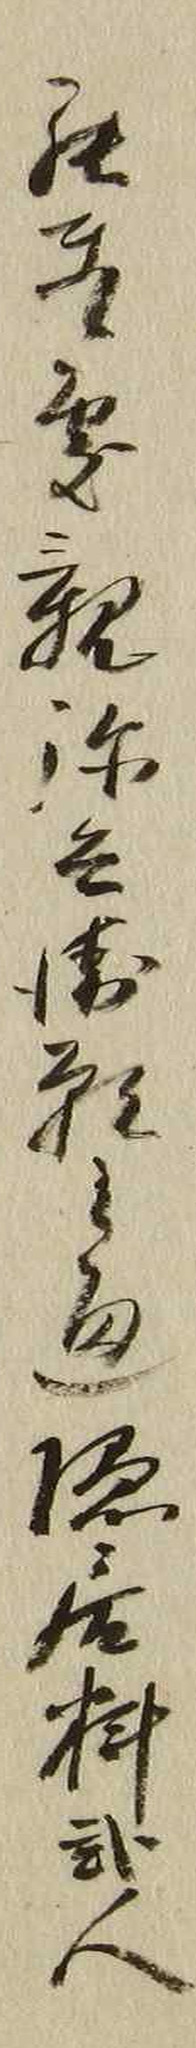罷在候処親弥兵衛願之通隠居料弐人
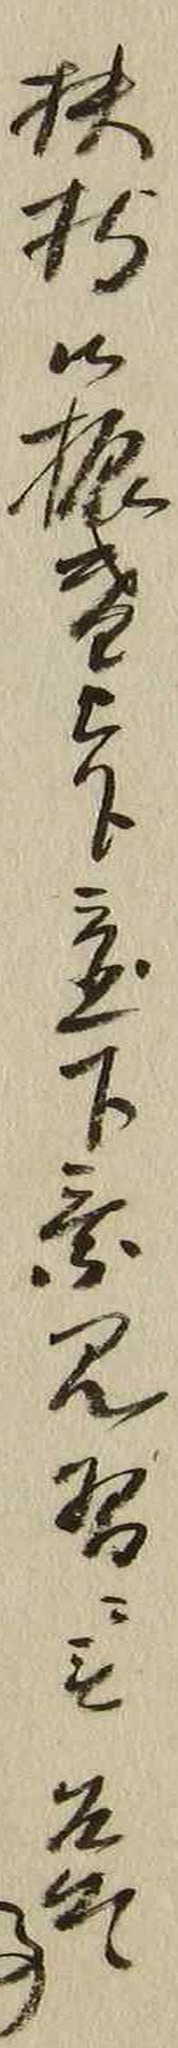扶持御振替被下置下乗見習に被召出候事
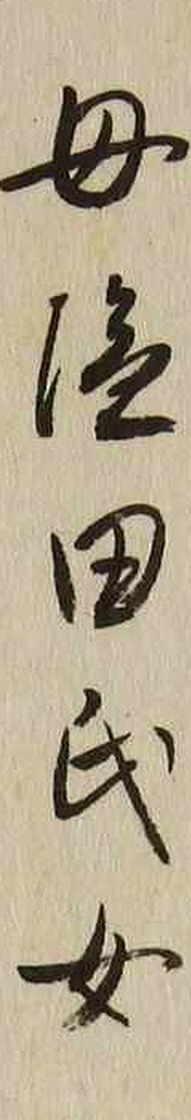母塩田氏女
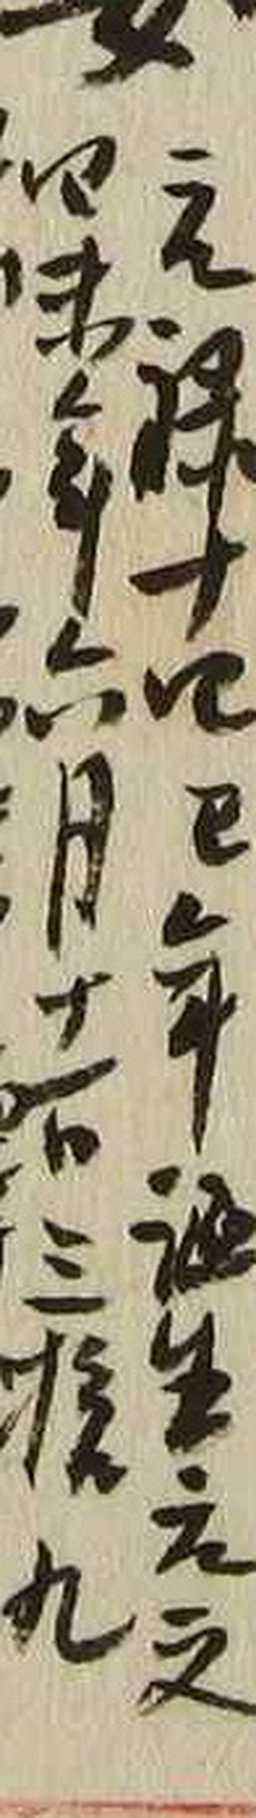四未年六月十一日三拾九
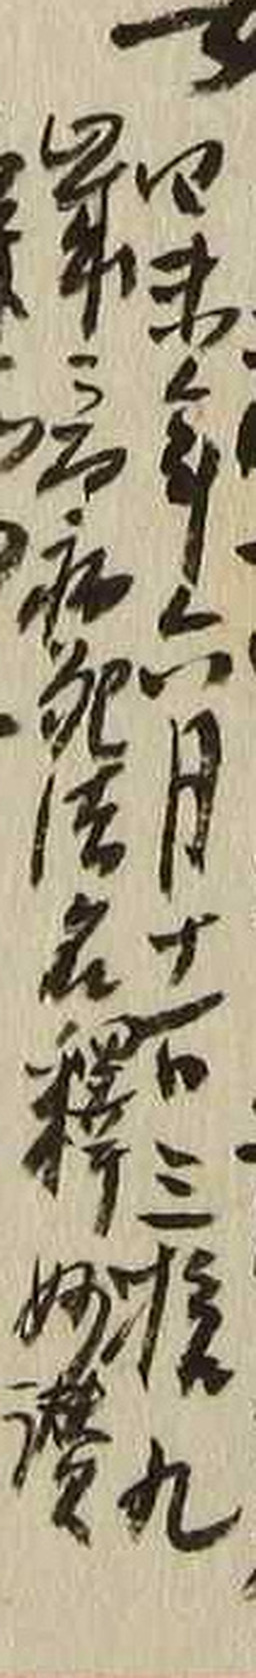歳に而病死法名釋妙讃
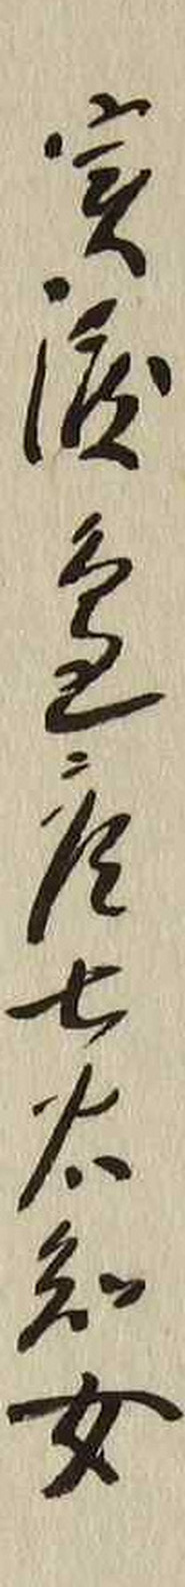実渡辺庄七忠知女
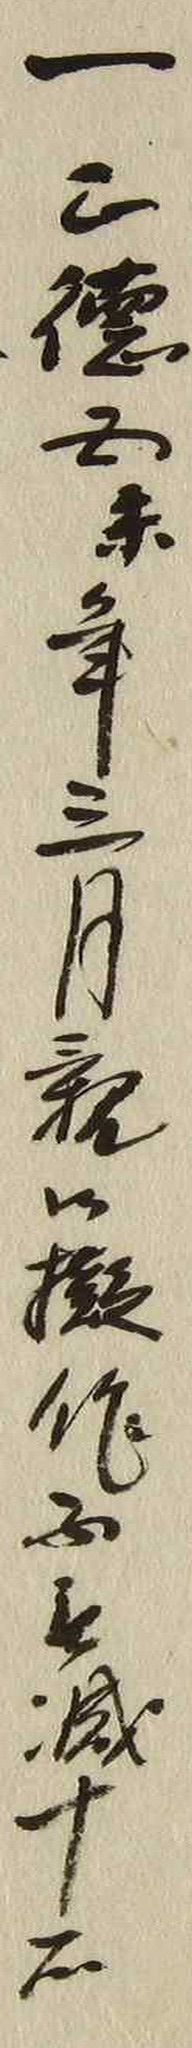一正徳五未年三月親御擬作不被減十石
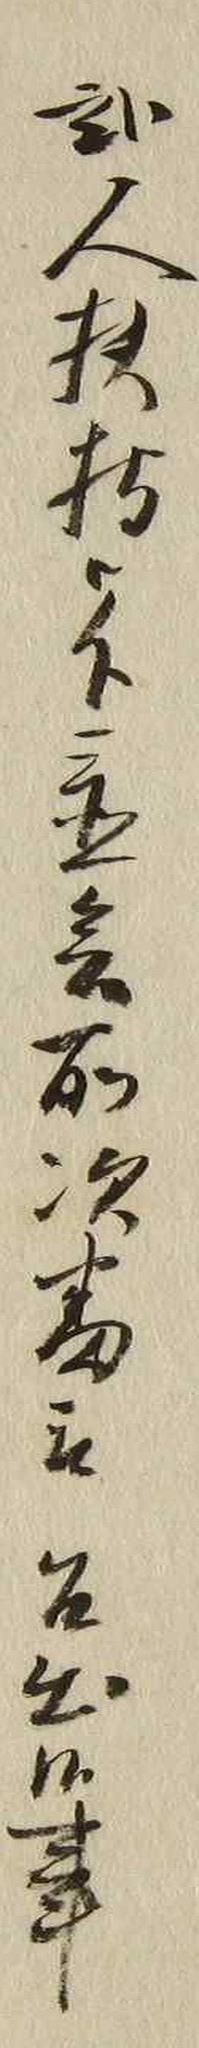弐人扶持被下置会所次番被召出候事
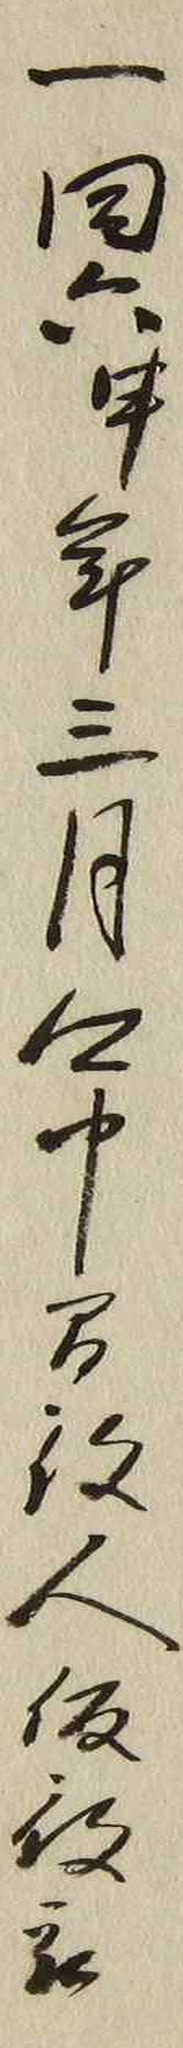一同六申年三月郷中間役人仮役被
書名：諸士系譜　巻之360　す之部10
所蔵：会津若松市立会津図書館
